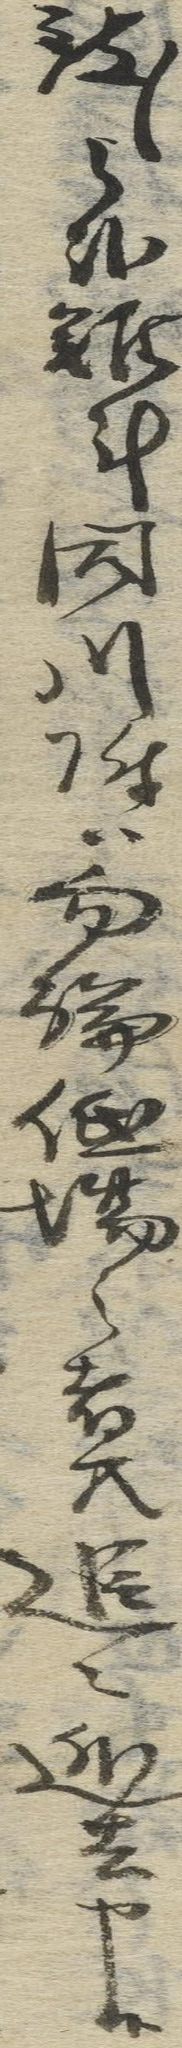致し候哉難計同所川附ハ勿論低場之者共追々逃去申候
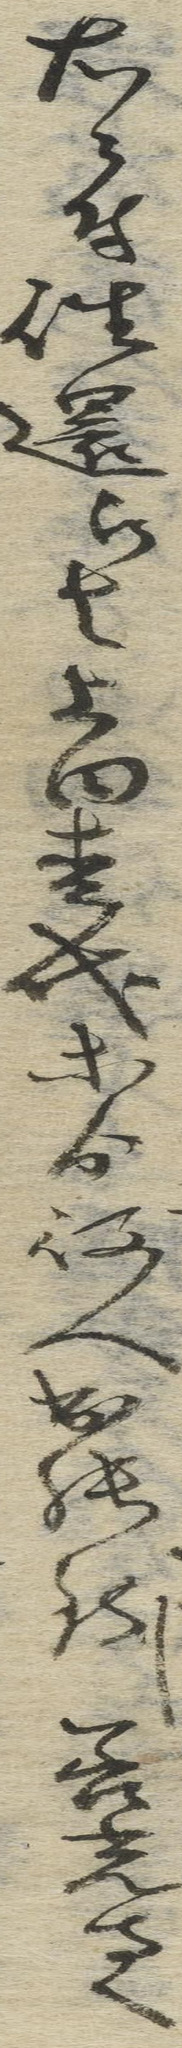右二付往還江ハ上田枩代等ゟ役人出張致し善光寺之
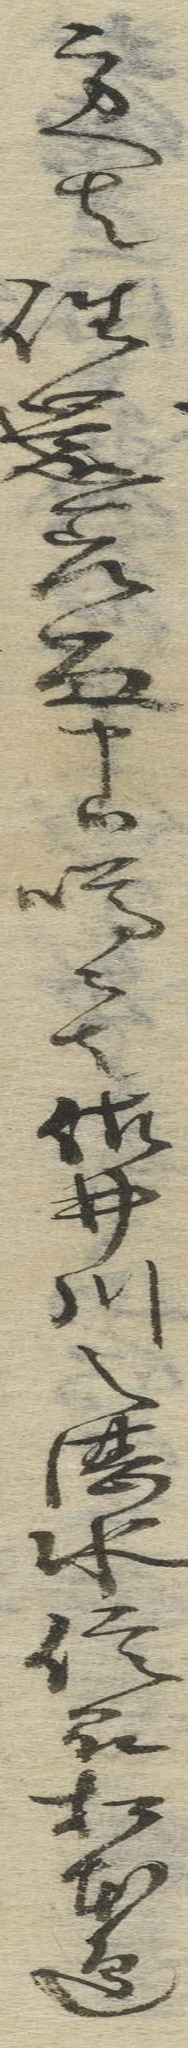方へは往還差留申候噂二は佐井川之湛水信州松本辺
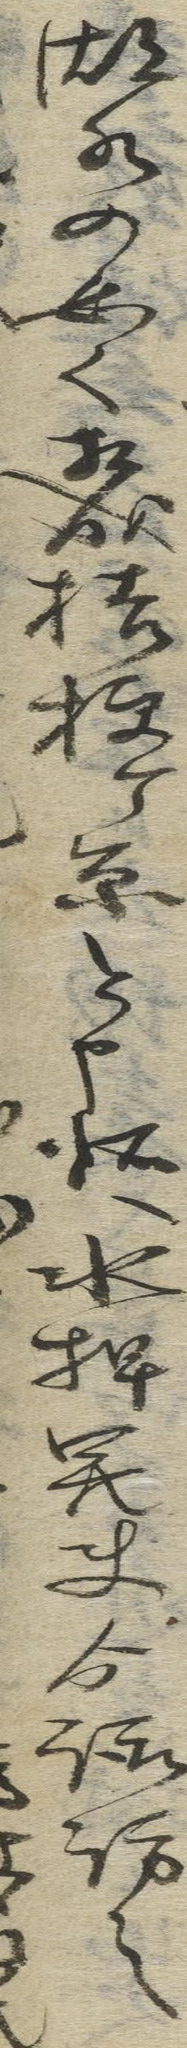湖水の如く相成桔梗ヶ原と申所へ水押開夫ゟ諏訪之
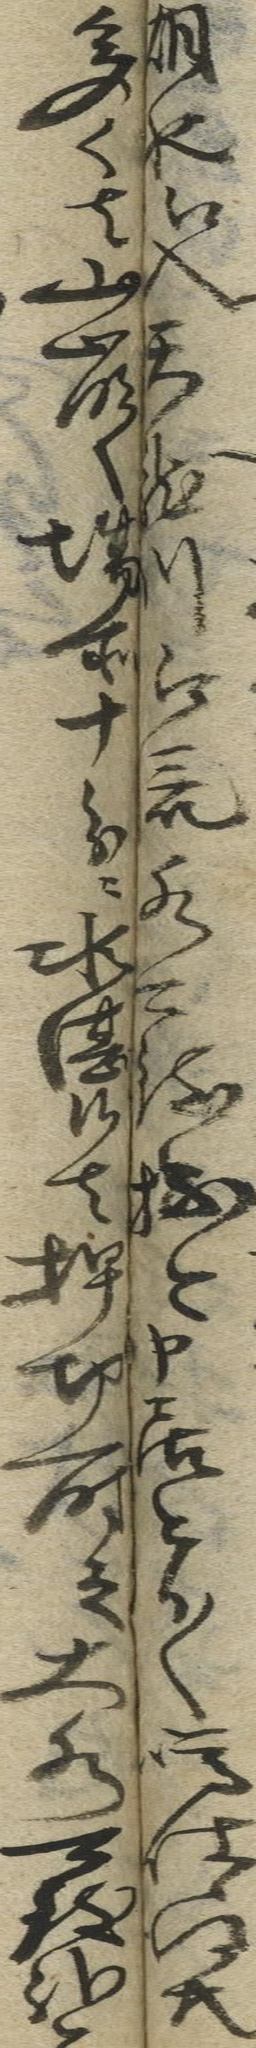多くは山崩之場所十分二水湛候而押切一時二大出水可致哉と
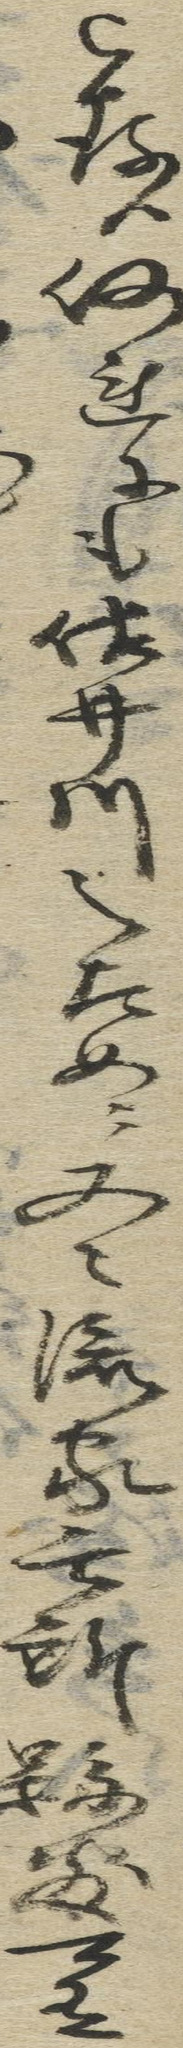被存候何れにも左井川之ため二又々流家亡所夥敷可有
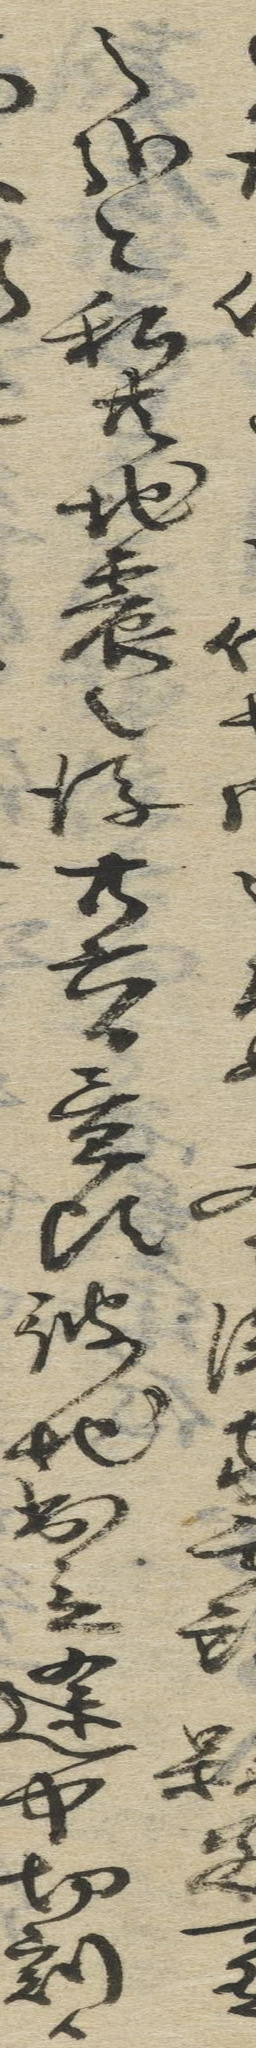候哉と私共地震之後廿六日昼頃彼地出立途中切割候
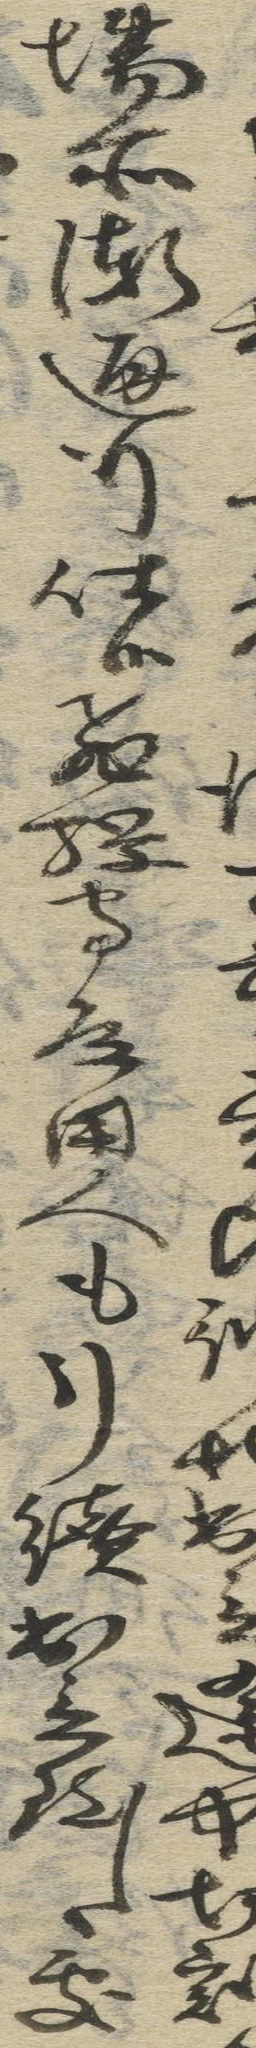場所漸通行仕候飛騨守殿用人も引続出立致し候処
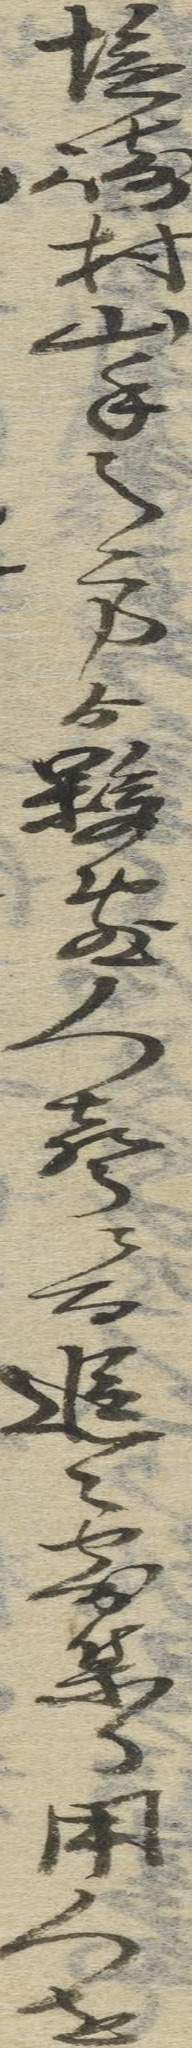塩崎村山手之方ゟ夥敷人声二付而追々寄集り用人を
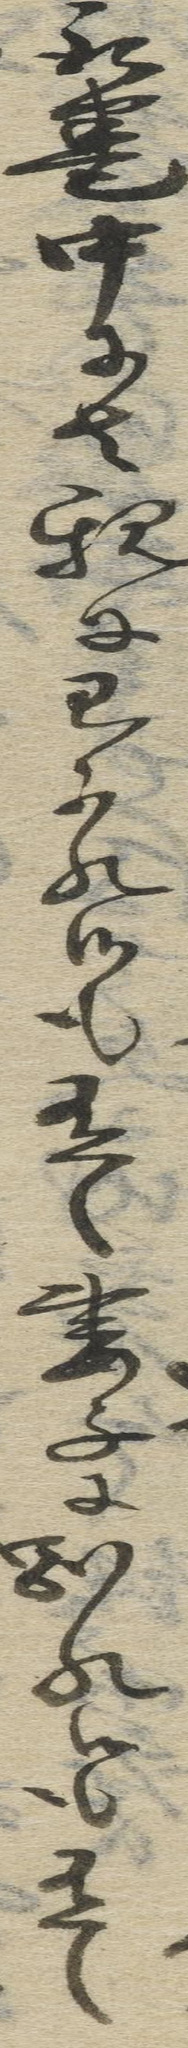取巻中には親にわかれ候も有之妻子に分れ候も有之
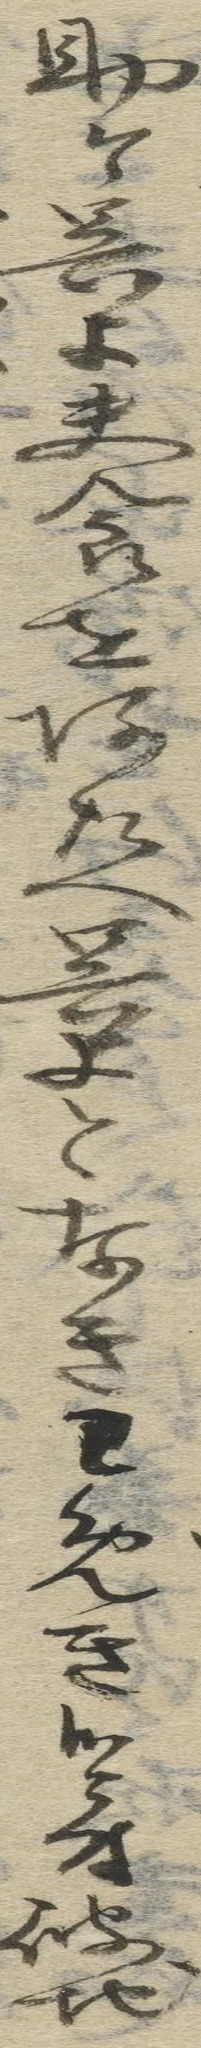助ヶ呉よ夫食をあたへ呉よとなきわめき候二付彼地
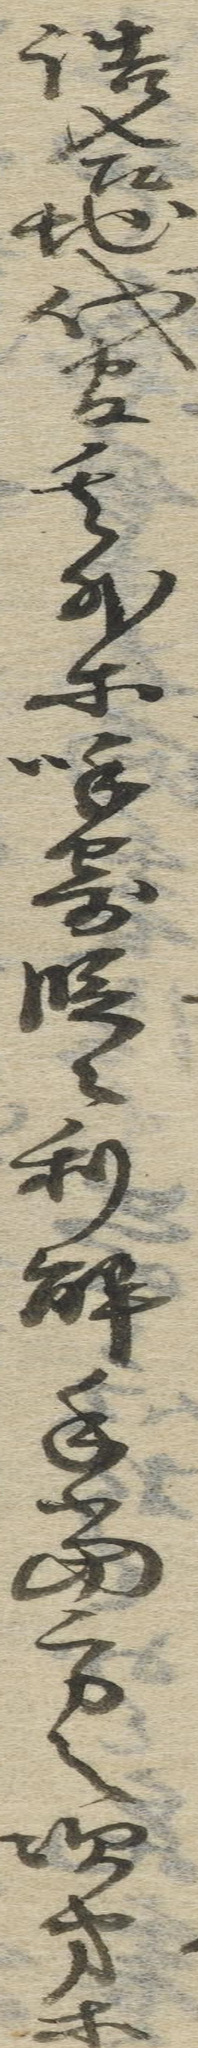詰合地代官其外等呼寄段々利解手当方之次第等
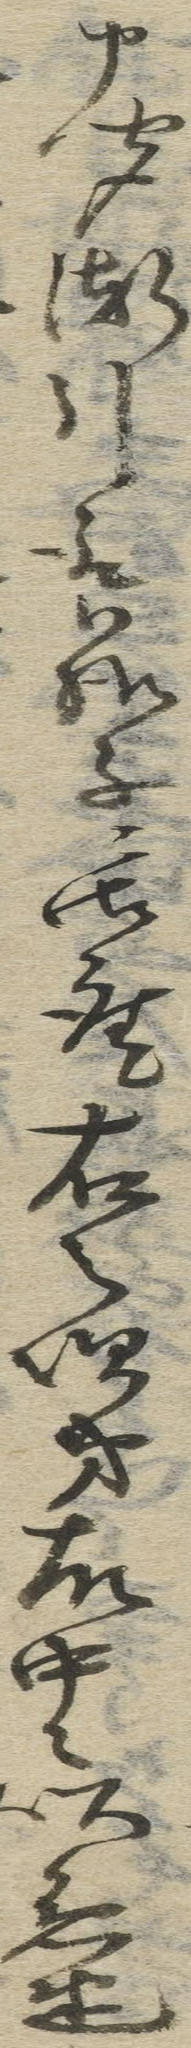申聞漸引取候様子二御座候右之次第故中々以急速
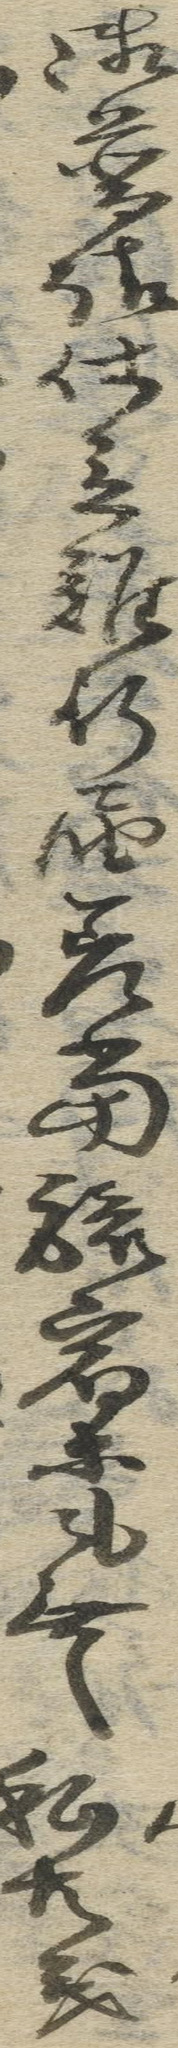御普請仕立難行届差当旅宿等も無之私共義
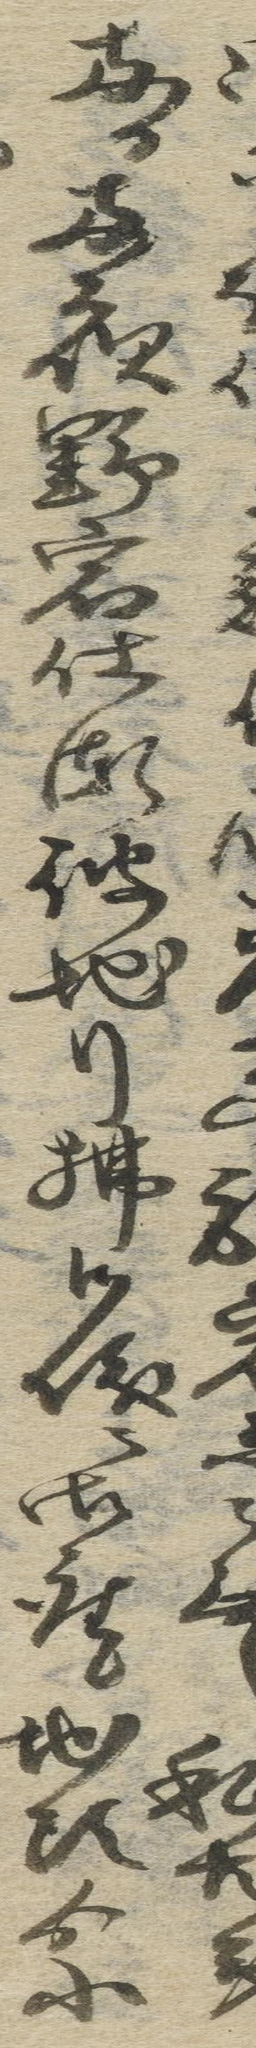両日両夜野宿仕漸彼地引払候儀二御座候地頭ゟ小
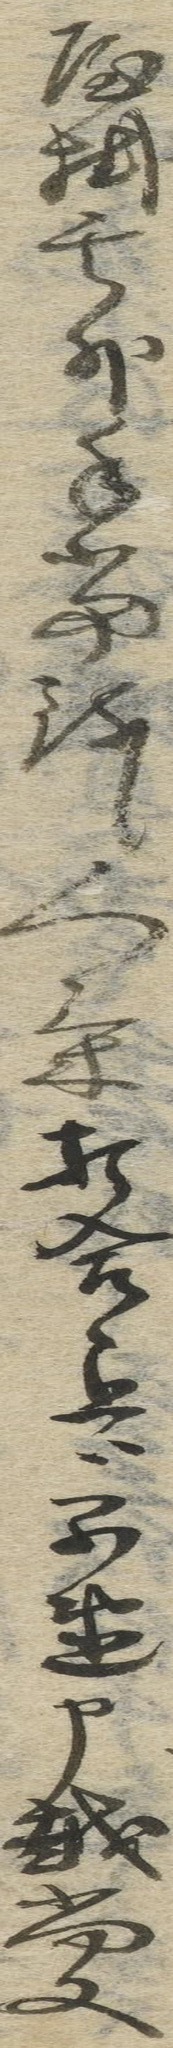屋掛其外手当致し人気折合候上ハ早速申越尚又
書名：信濃越後　地震書留
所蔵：東京大学地震研究所図書室 Earthquake Research Institute Library, The University of Tokyo, JAPAN
